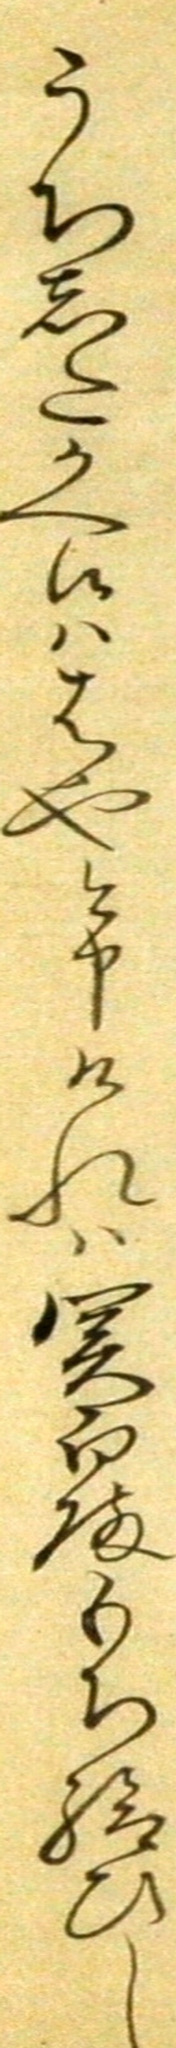うちしたかへ候ははやと申けれは関白殿もち給ひし
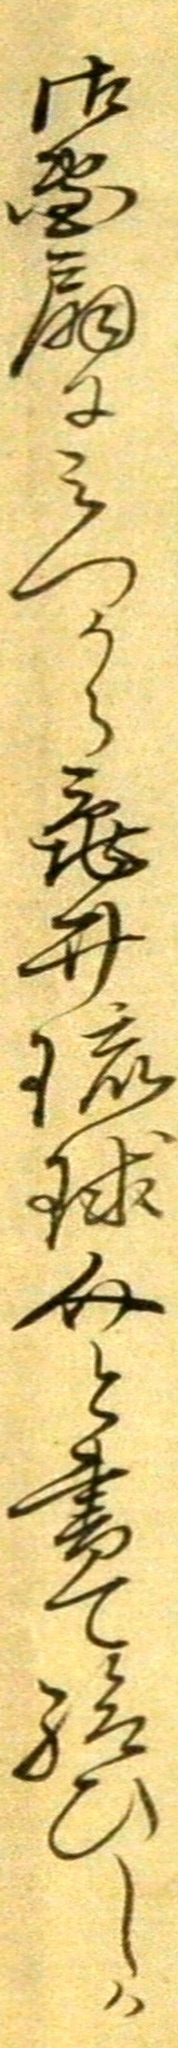御団扇にみつから亀井琉球介と書て給ひしか

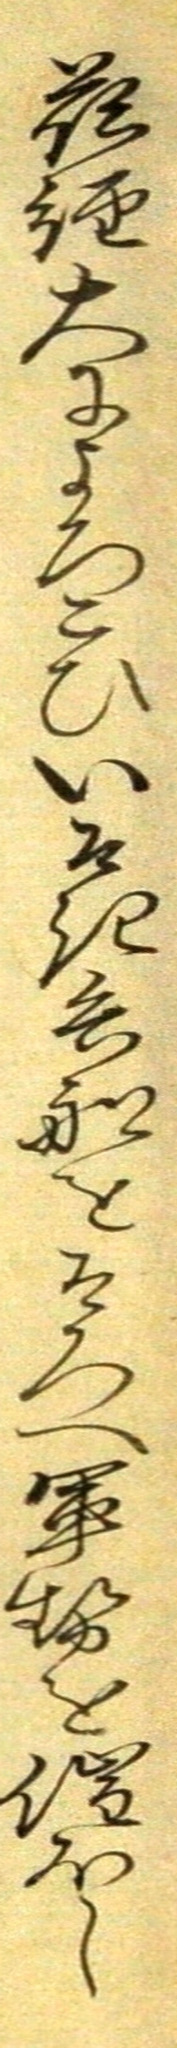茲経大によろこひいそき兵船をそろへ軍勢を催ほし
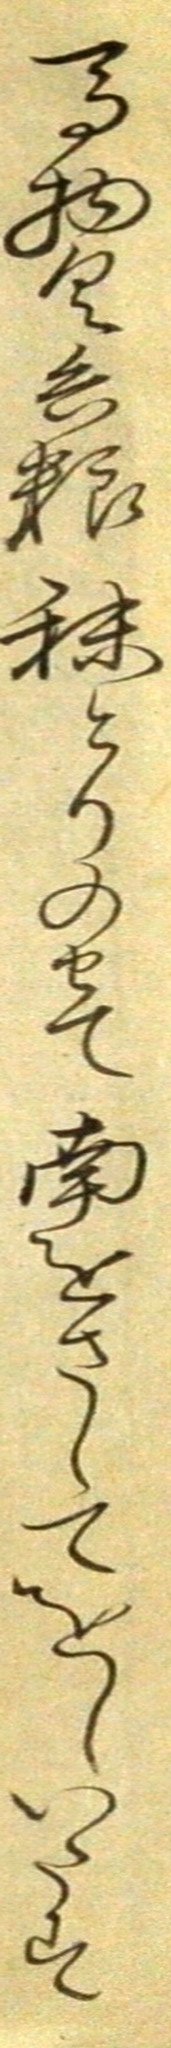馬物具兵粮秣とりのせて南をさしてをしいたす
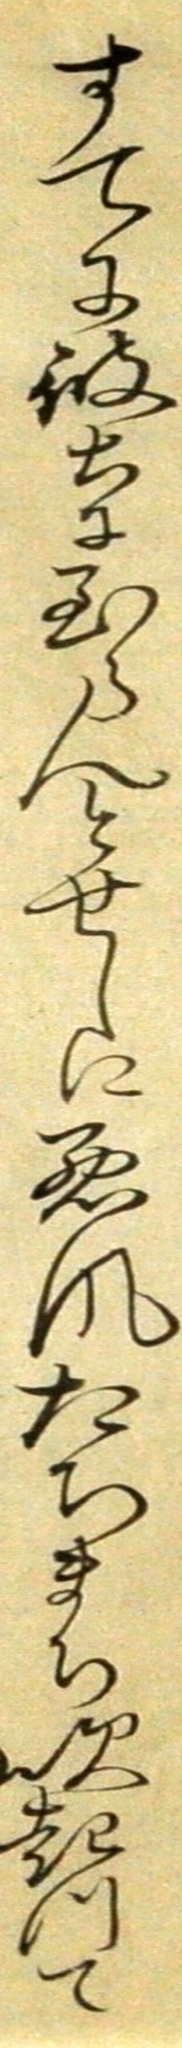すてに彼ちに至らんとせしに悪風たちまち吹起つて
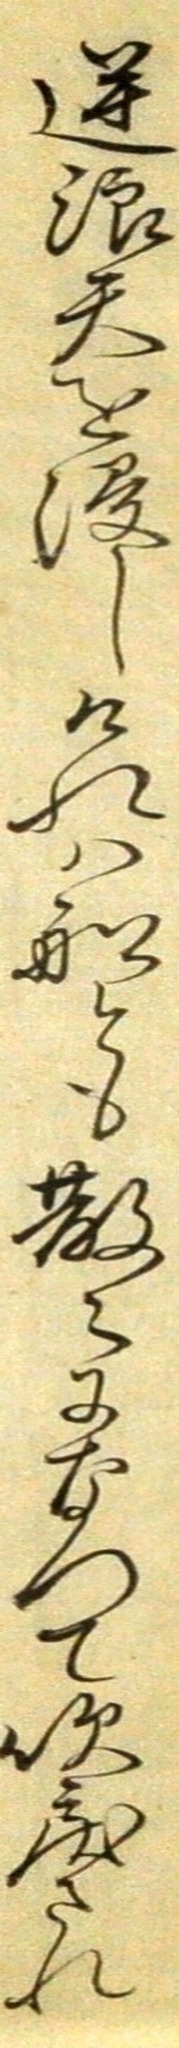逆浪天を浸しけれは船とも散々になつて吹戻され
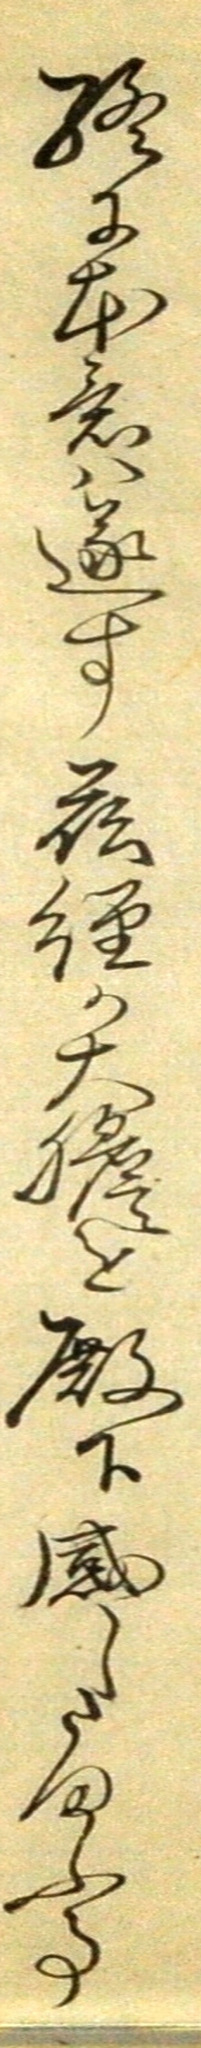終に本意は遂す茲経か大胆を殿下感したまふ事
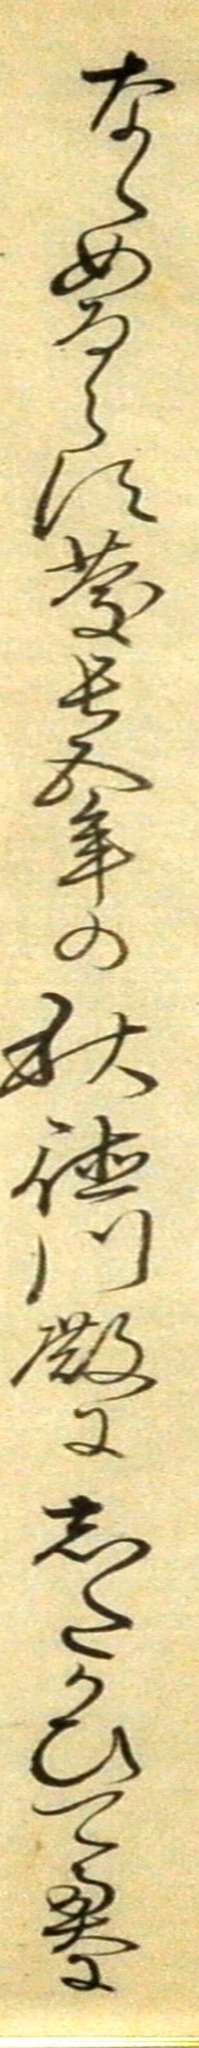なゝめならす慶長五年の秋徳川殿にしたかひて奥に
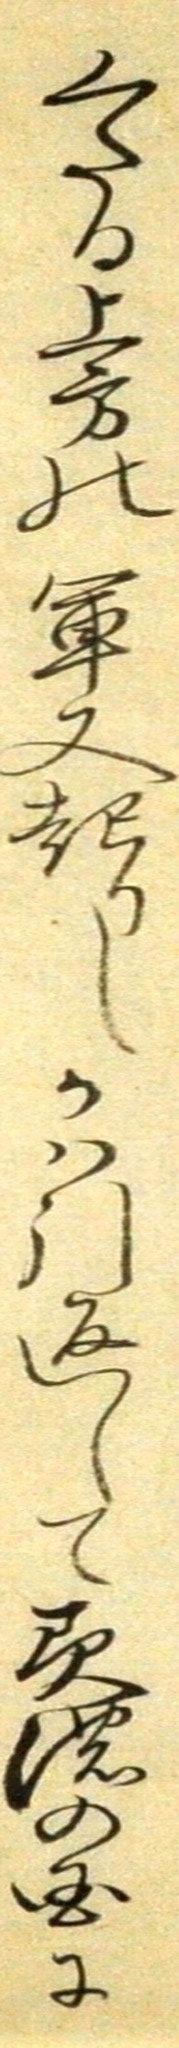くたる上方の軍又起りしかは引返して美濃の国に
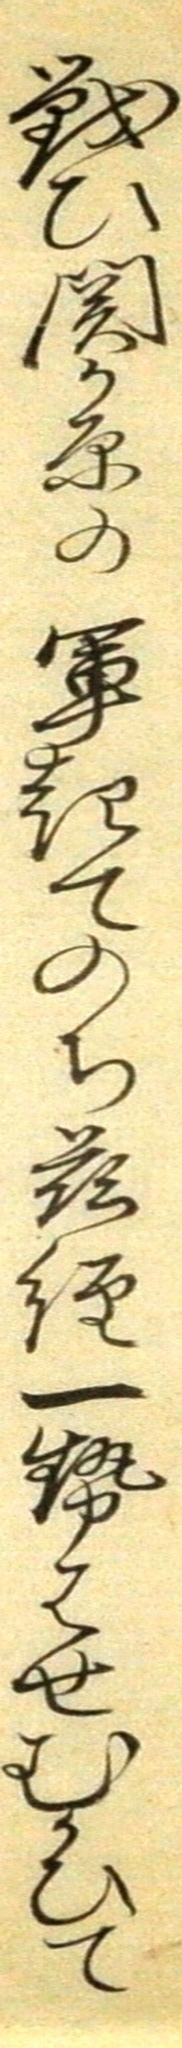戦ひ関か原の軍起てのち茲経一勢はせむかひて
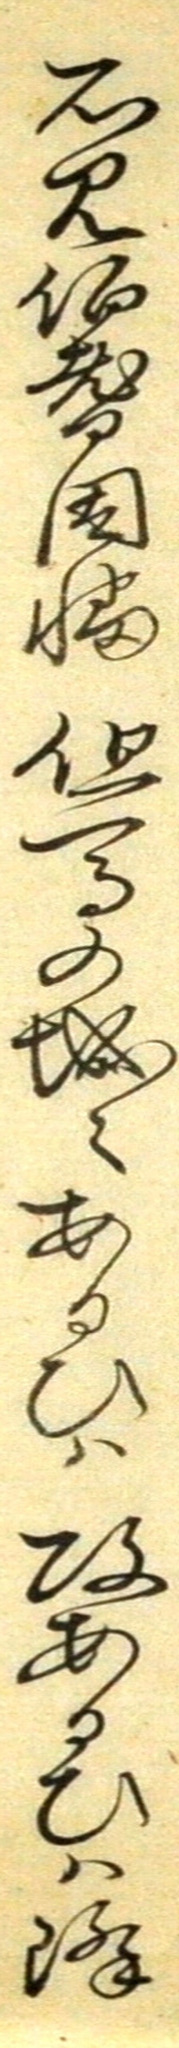石見伯耆因幡但馬の城々あるひは攻あるひは降
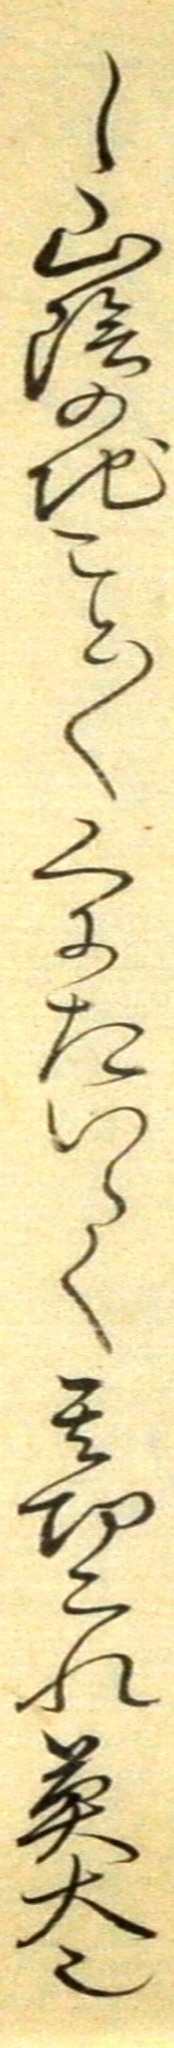し山陰の地こと〳〵くにたいらく其功これ莫大也
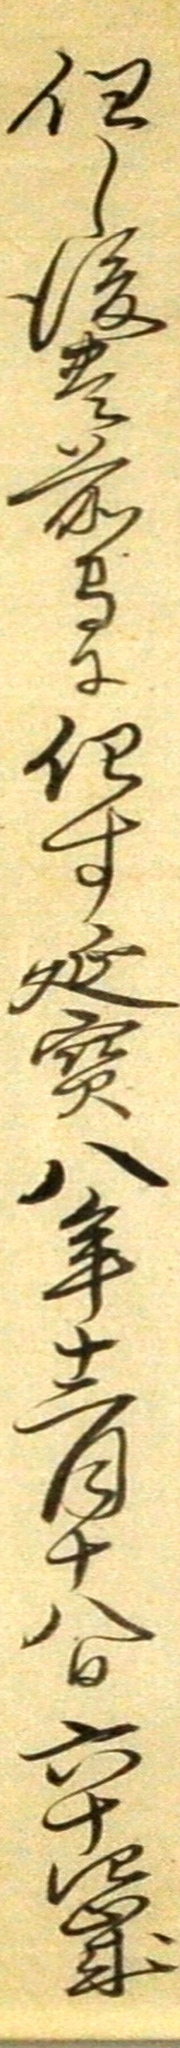任し後豊前守に任す延宝八年十二月十八日六十四歳
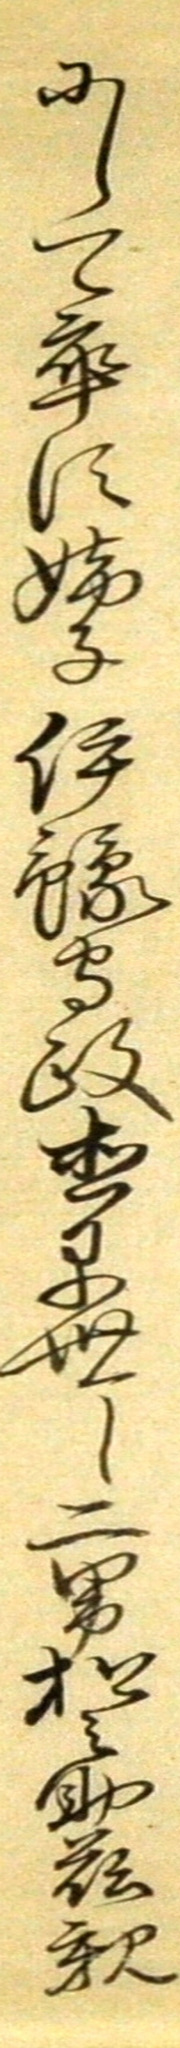にして卒す嫡子伊予守政直早世し二男松之助茲親

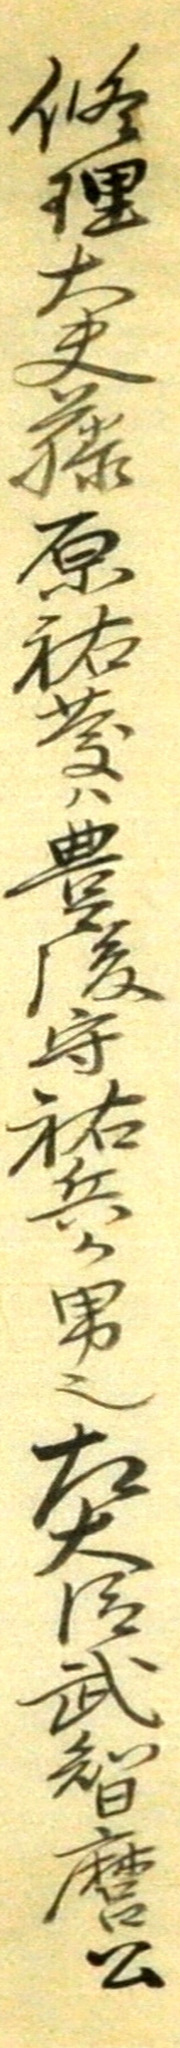修理大夫藤原祐慶は豊後守祐兵か男也左大臣武智麿公
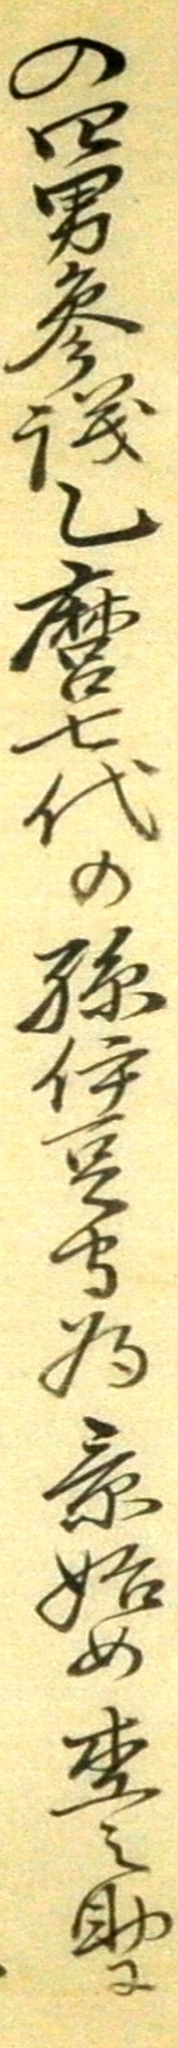の四男参議乙麿七代の孫伊豆守為景始め杢之助に
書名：藩翰譜（九・下）
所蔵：伊那市立高遠町図書館・合同会社AMANE
